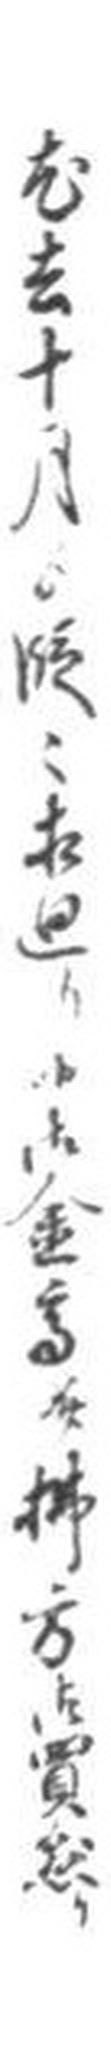尤去十月ゟ段々相廻り候御金高幷払方御買懸り
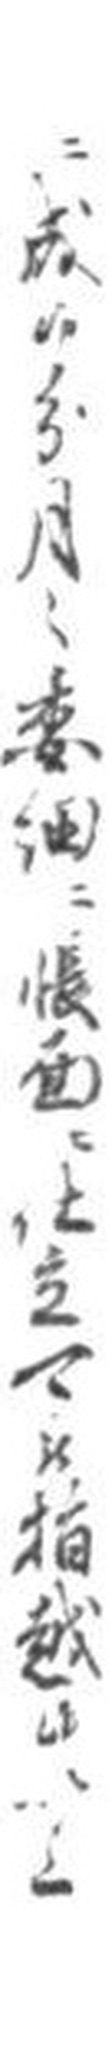ニ成候分月々委細ニ帳面ニ仕立可被指越候以上
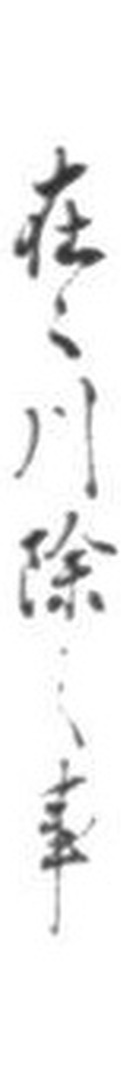在々川除之事
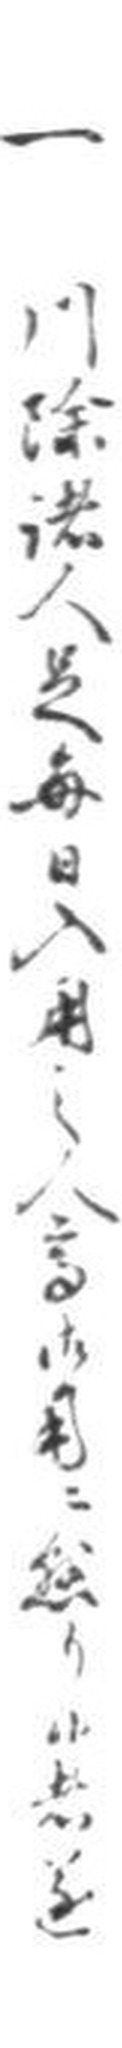一川除諸人足毎日入用之人高御用ニ懸り候者遂
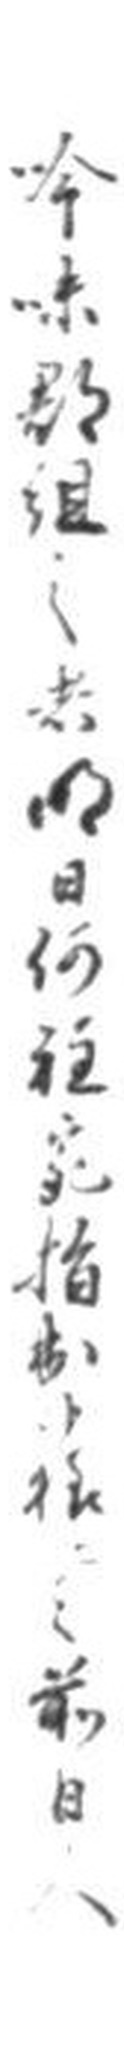吟味郡組之者明日何程宛指出候様ニと前日人
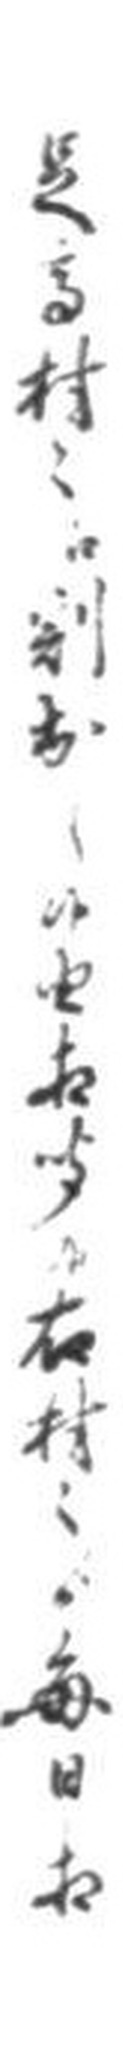足高村々江割出し候由相聞候右村々ゟ毎日相
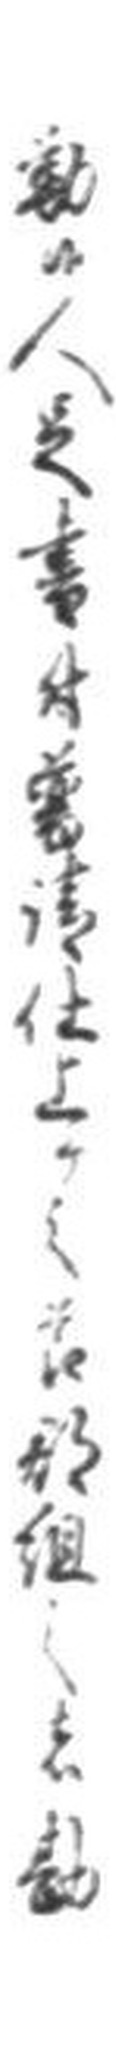勤候人足書付普請仕上ケ之節郡組之者勘
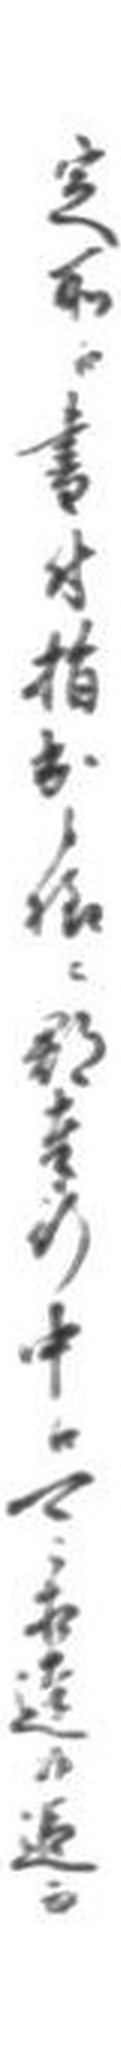定所江書付指出候様ニ郡奉行中江可被相達候追而
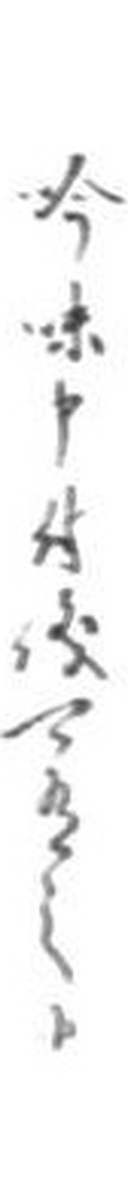吟味申付儀可有之候
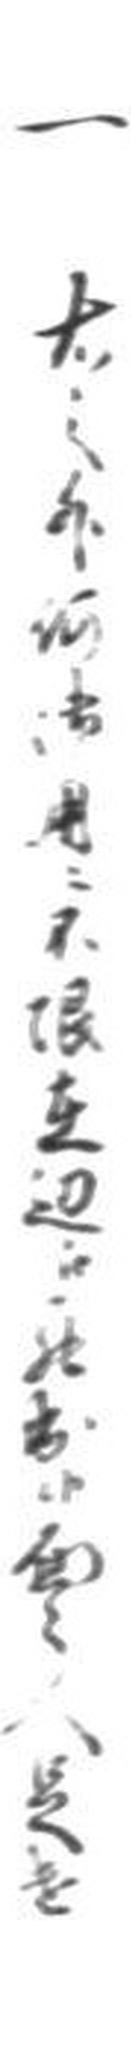一右之外何御用ニ不限在辺江罷出候面々人足遣
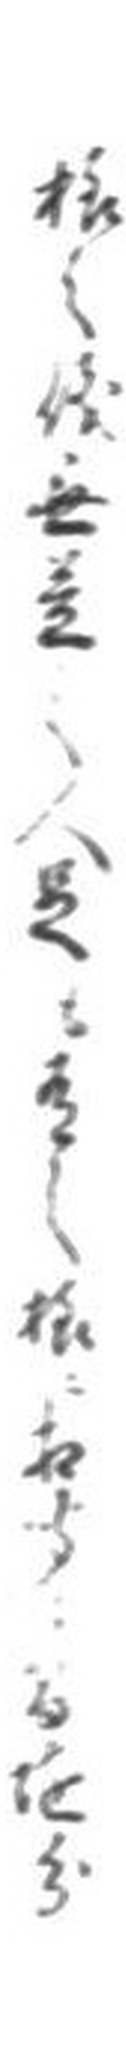様之儀無益之人足も有之様ニ相聞候間随分
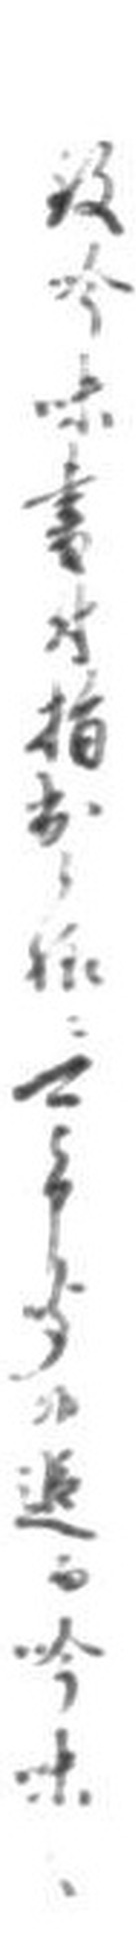致吟味書付指出候様ニ可被申聞候追而吟味之
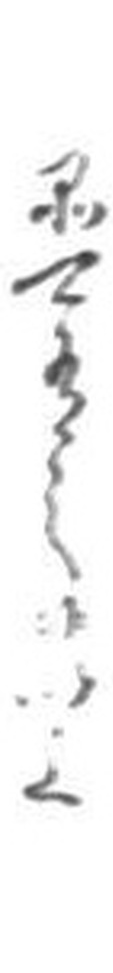品可有之候以上
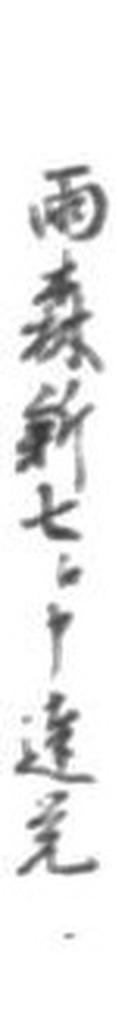雨森新七江申達覚
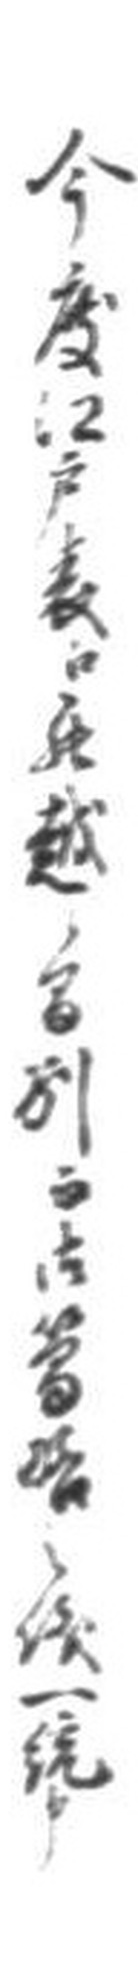今度江戸表江罷越候間別而御簡略之儀一統申

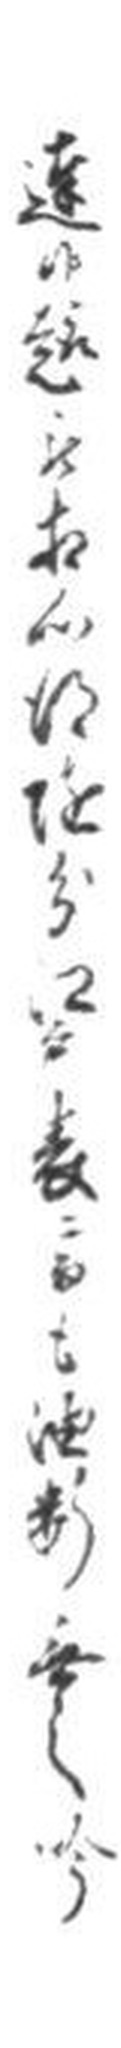達候趣被相心得随分江戸表ニ而も油断無之吟
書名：家譜 三十九 宗矩公 享保十年
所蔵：福井県文書館 Fukui Prefectural Archives
